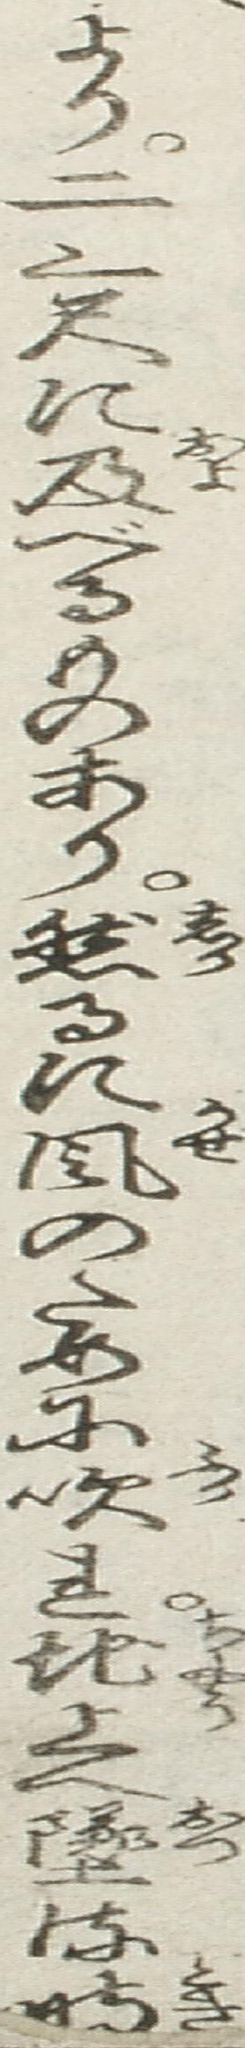より。二三尺に及べるものあり。然るに風のために吹れ。地上へ堕る時
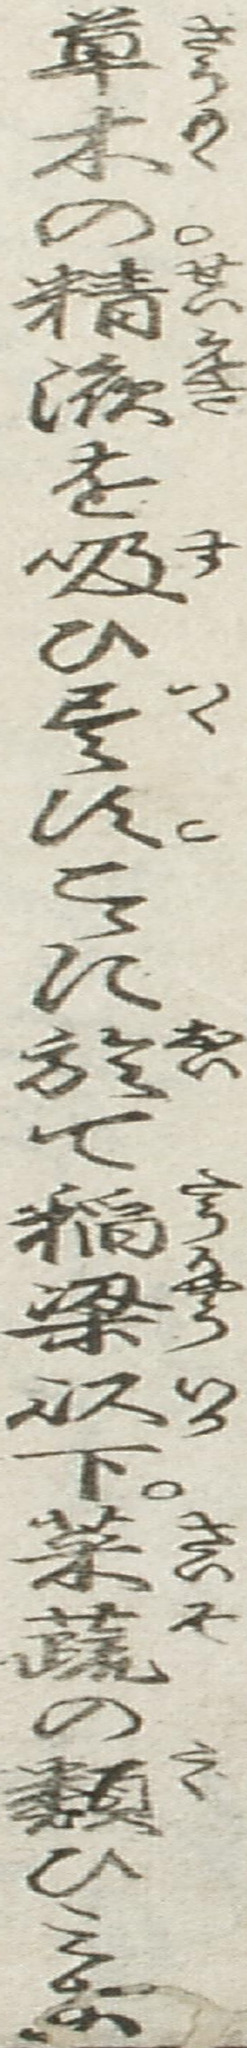草木の。精液を吸ひ尽す。こゝに於て稲梁以下。菜蔬の類ひみな
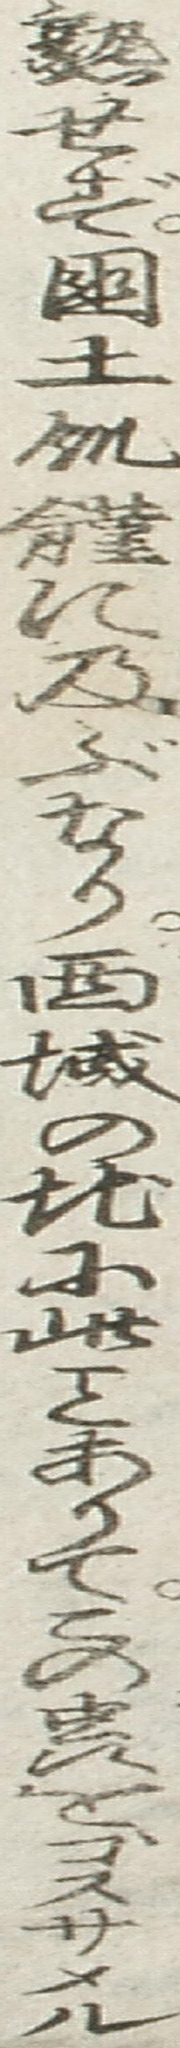熟せず。国土飢饉に及ぶなり。西域の地に此ことありて。この蟲をゴスサメル
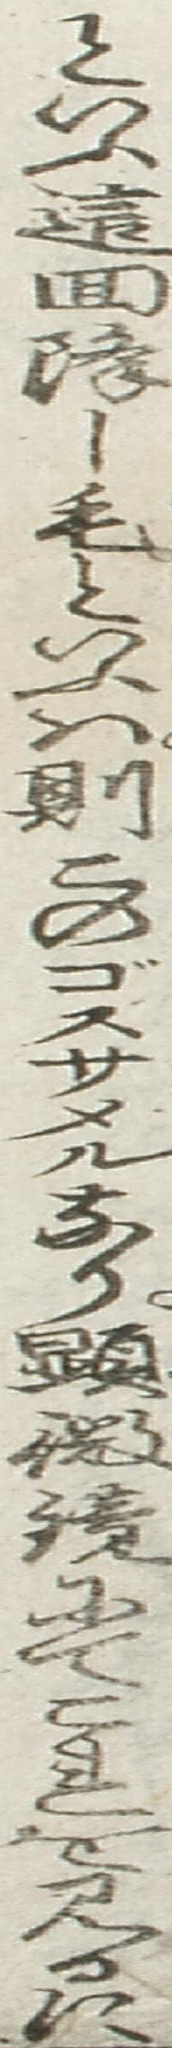といふ。這回降し毛といふは。則このゴスサメルなり。顕微鏡にてこれを見るに。
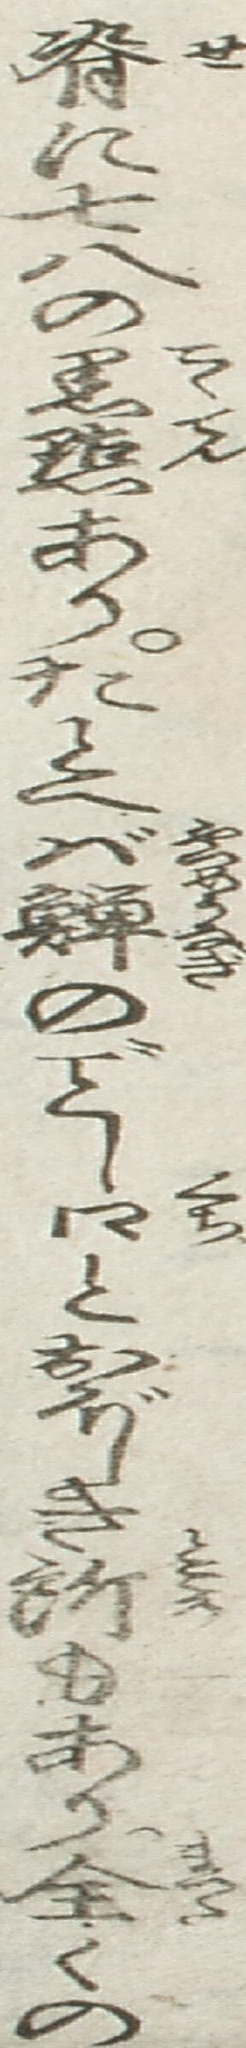背に七八の黒點あり。たとへば鱓のごとし口とおぼしき所もあり。全くの
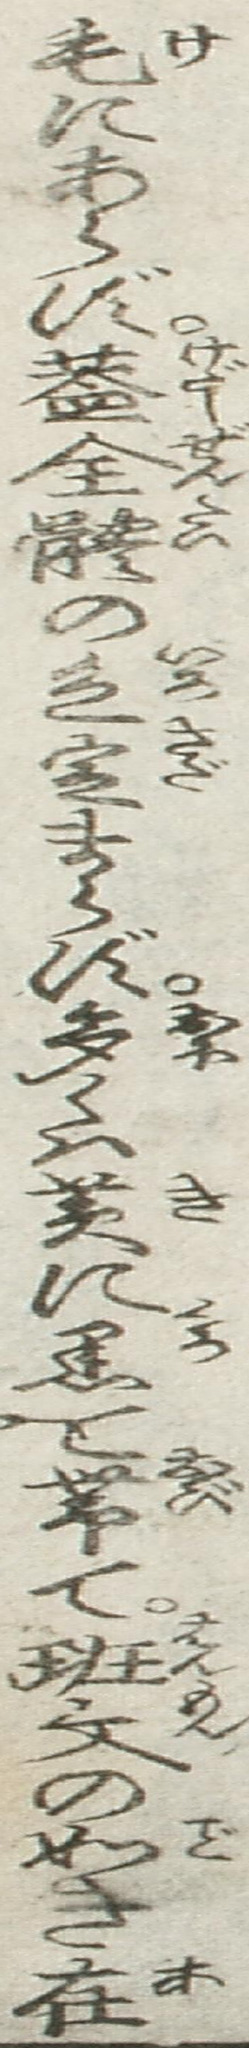毛にあらず。蓋全体の色定まらず。多くは黄に黒を帯て斑文の如き在
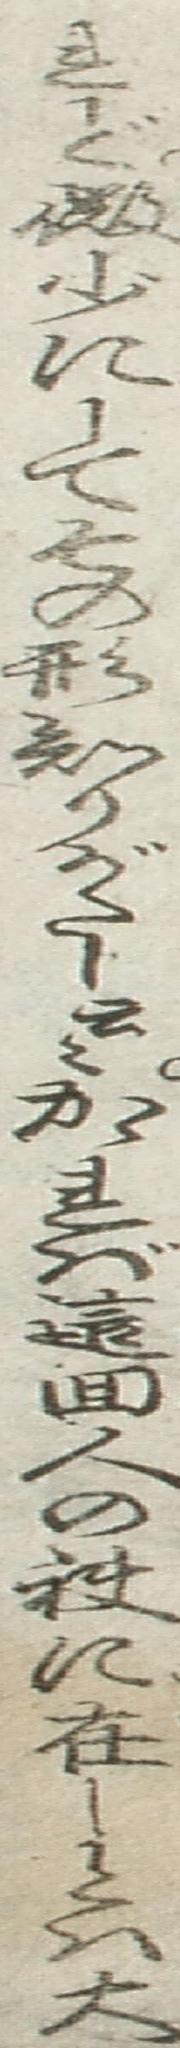れど。微少にしてその形知りがたし云々。かゝれば這回人の袂に在しとは大
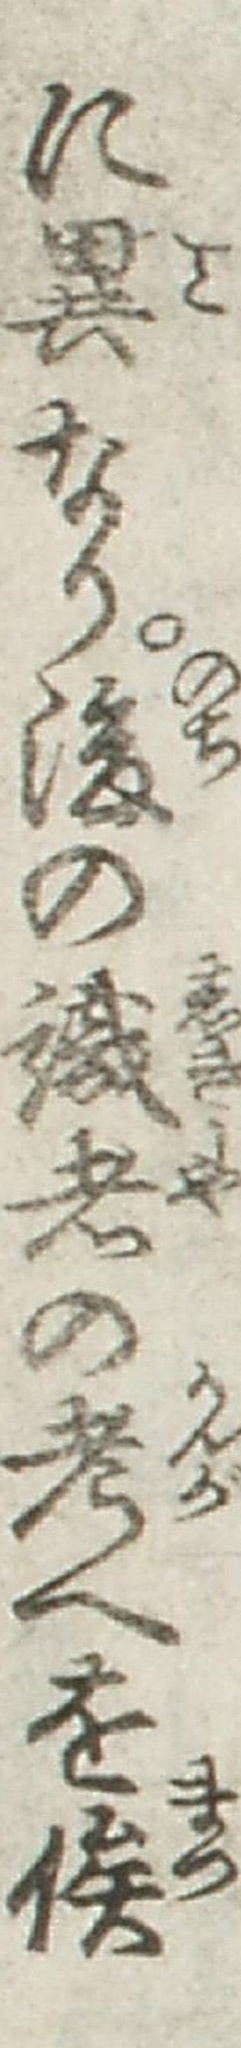に異なり。後の識者の考へを俟

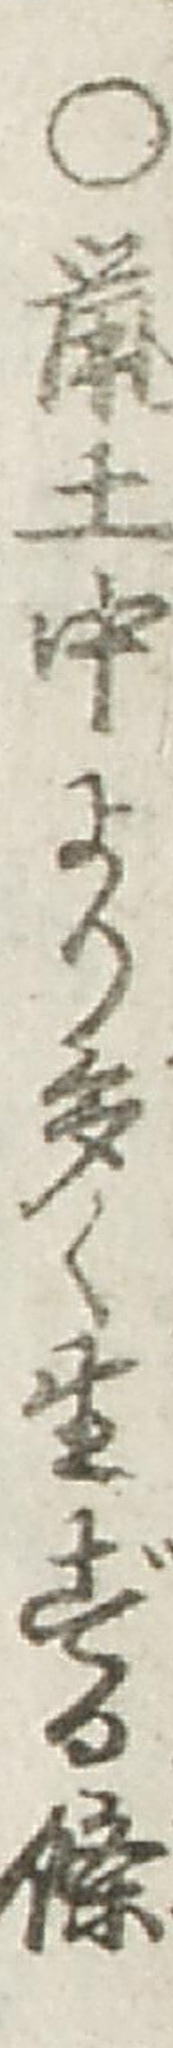〇鼠土中より多く生ずる條
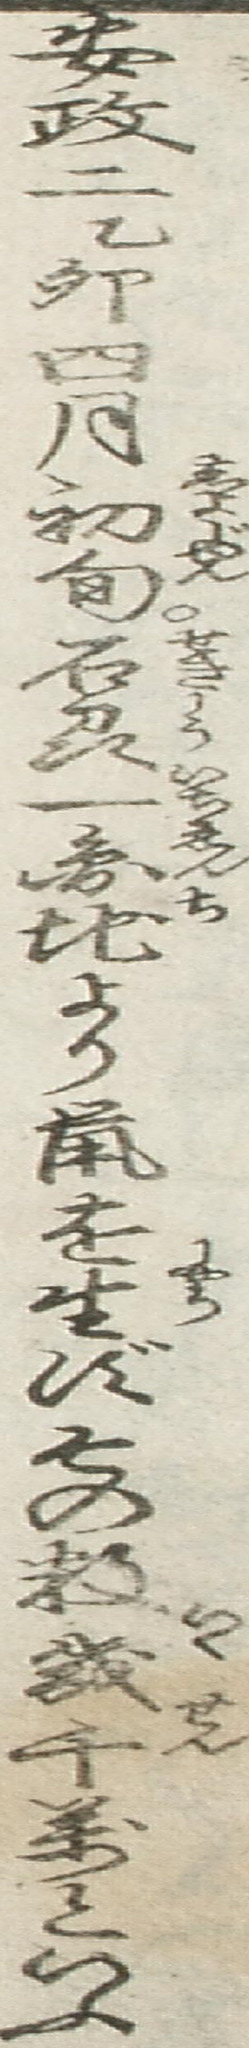安政二乙卯四月初旬。石州一円地より鼠を生ずその数幾千萬といふ
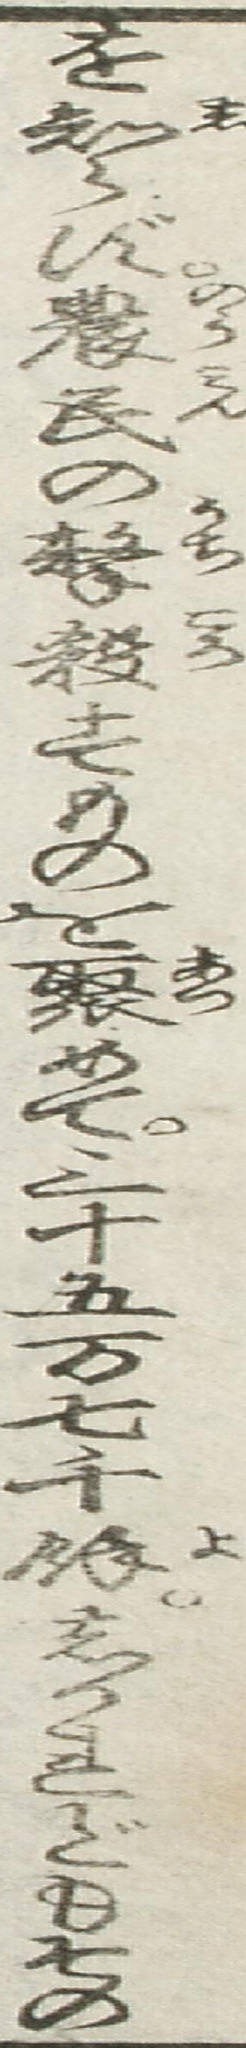を知らず。農民の撃殺すものを聚めて。三十五万七千余。然れどもその
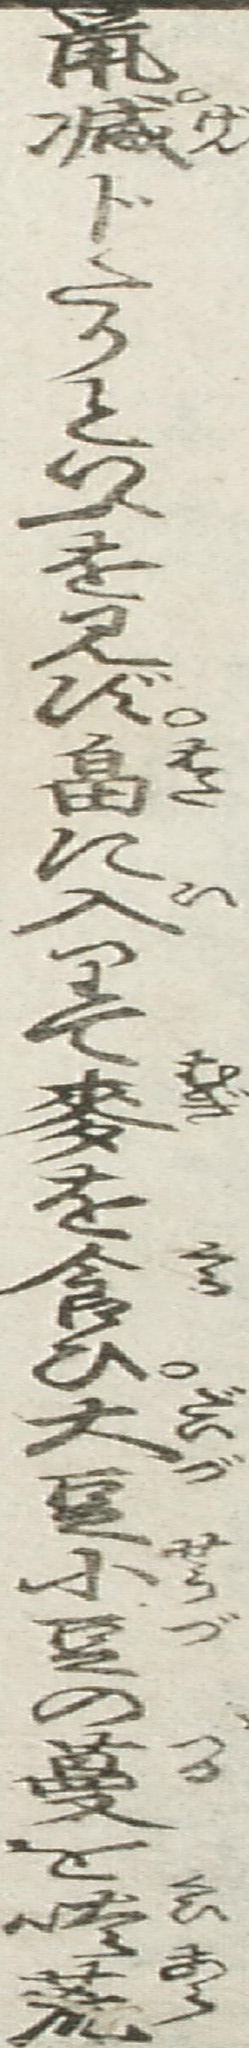鼠。減じたりといふを見ず。畠に入りて麦を食ひ。大豆小豆の蔓を啖荒
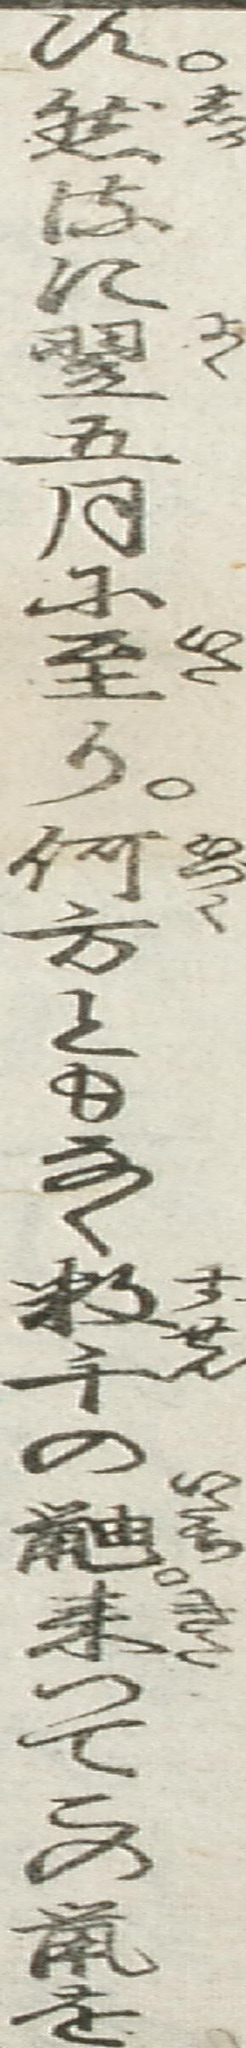す。然るに翌五月に至り。何方ともなく数千の鼬。来つてこの鼠を
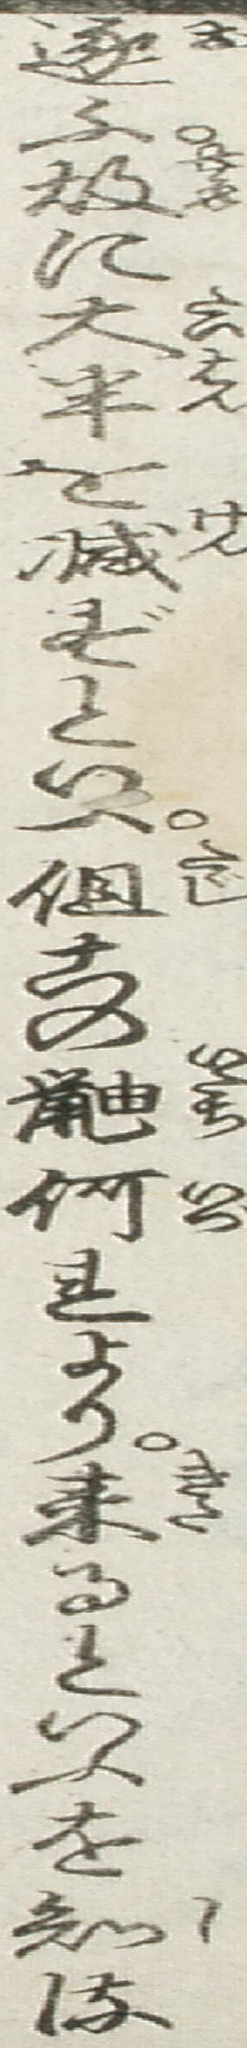逐ふ。故に大半を減ずといふ。但この鼬何れより。来るといふを知る
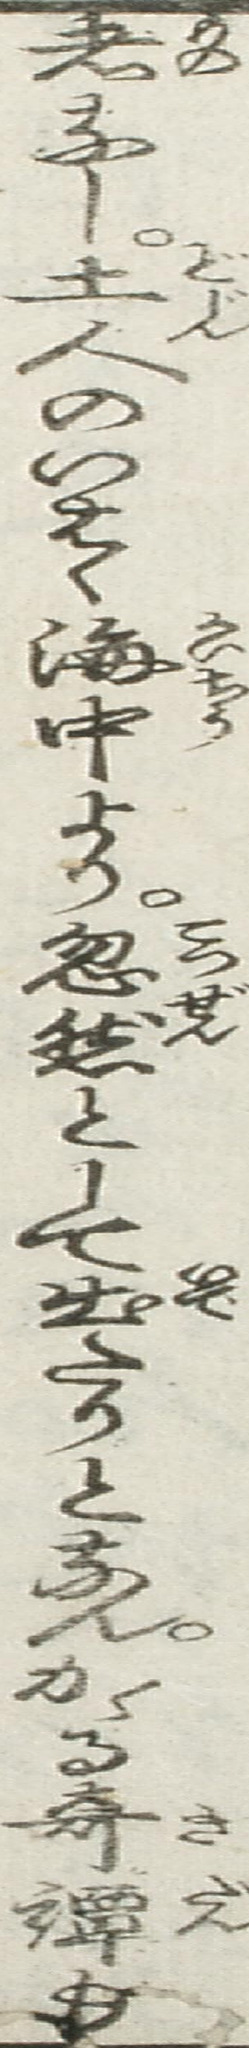者なし。土人のいはく海中より。忽然として出たりとなん。かゝる奇譚も
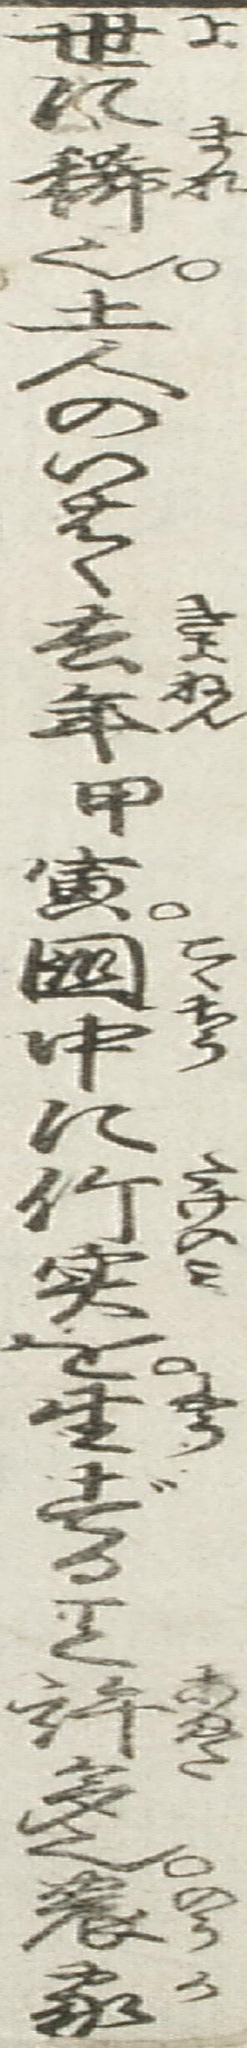世に稀也。土人のいはく去年甲寅。国中に竹実を。生ずること許多也。農家
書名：安政見聞録　下
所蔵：東京大学地震研究所図書室 Earthquake Research Institute Library, The University of Tokyo, JAPAN
